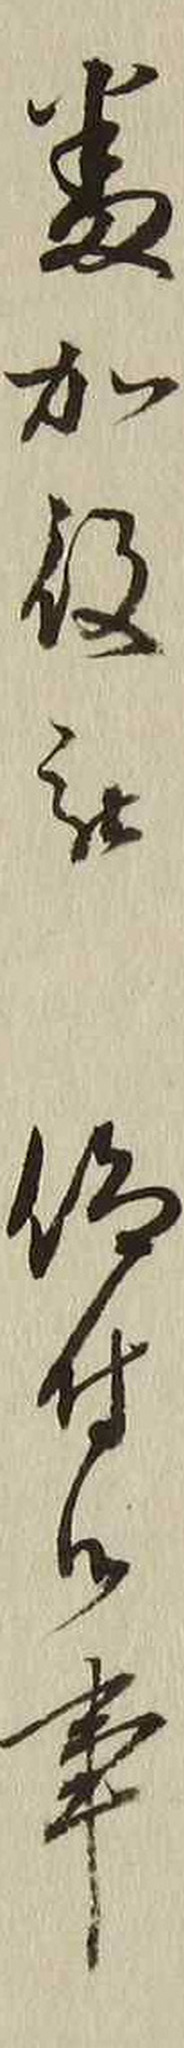番加役被仰付候事
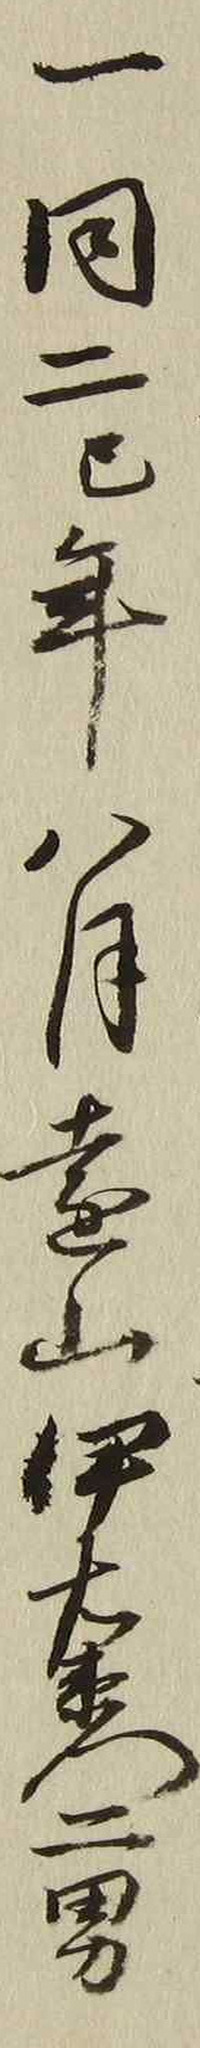一同二巳年八月遠山伊右衛門二男
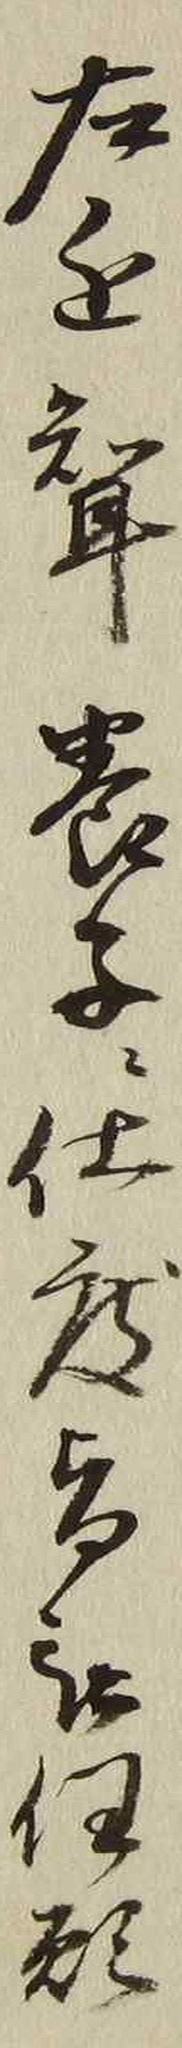左近婿養子ニ仕度旨被任願
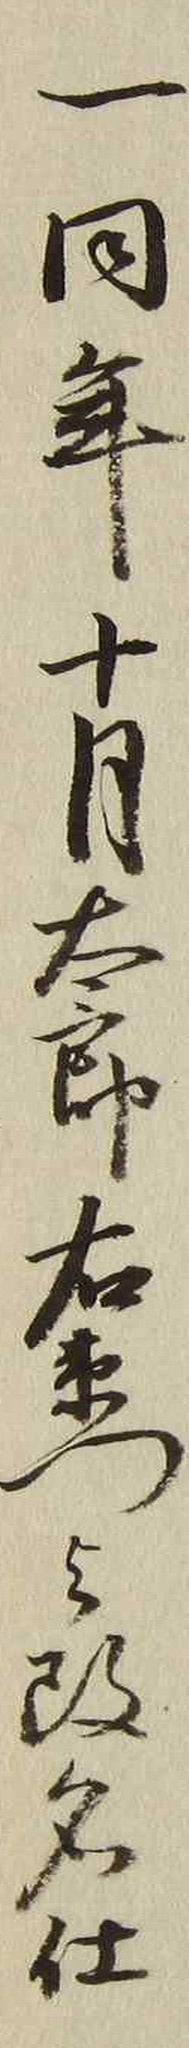一同年十月太郎右衛門与改名仕
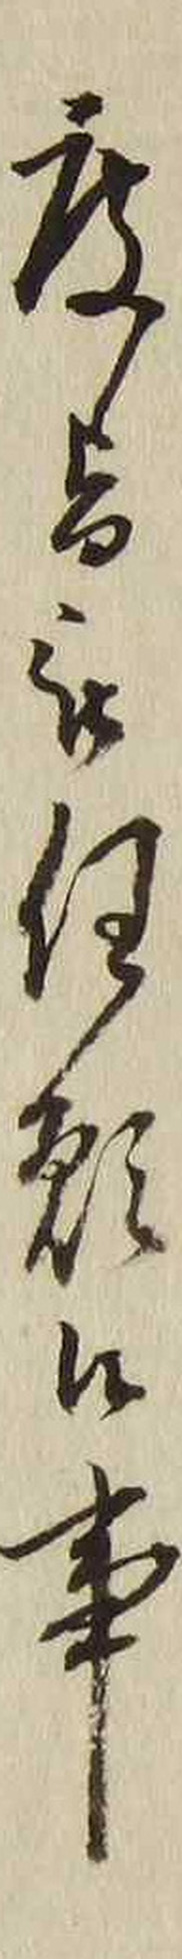度旨被任願候事
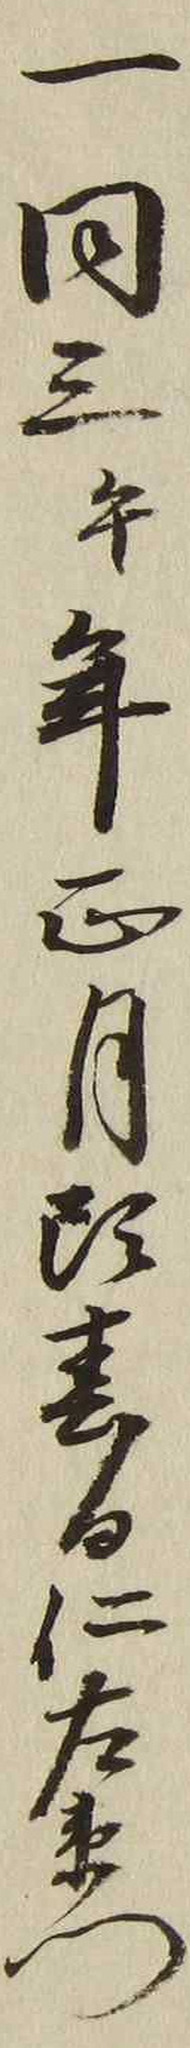一同三午年正月頭春日仁左衛門

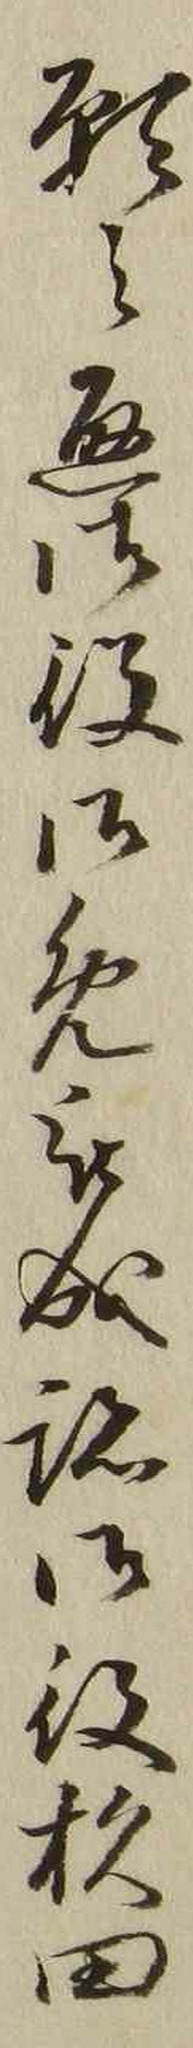願之通御役御免被成跡御役杉田
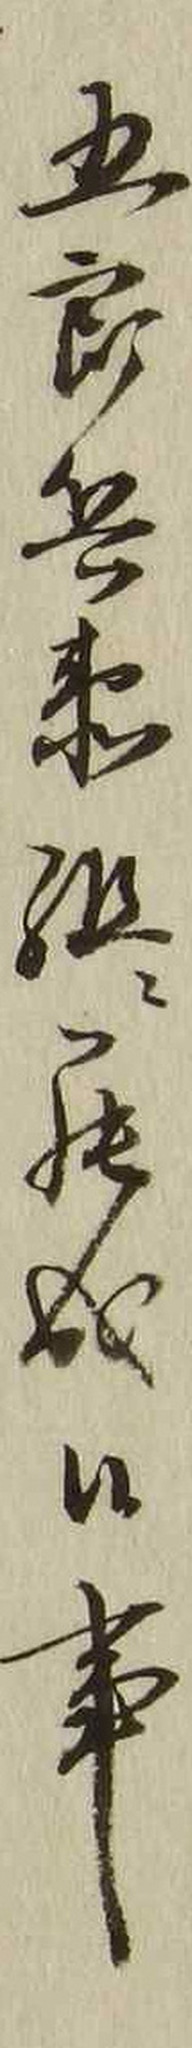五郎兵衛組ニ罷成候事
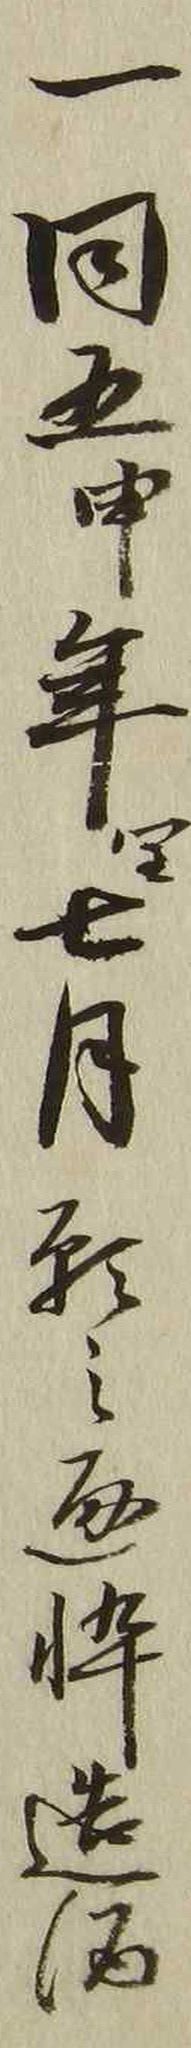一同五申年閏七月願之通忰造酒
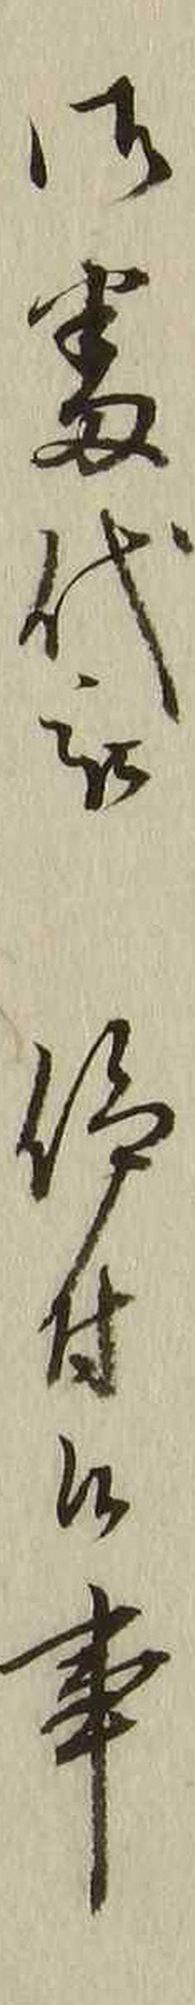御番代被仰付候事
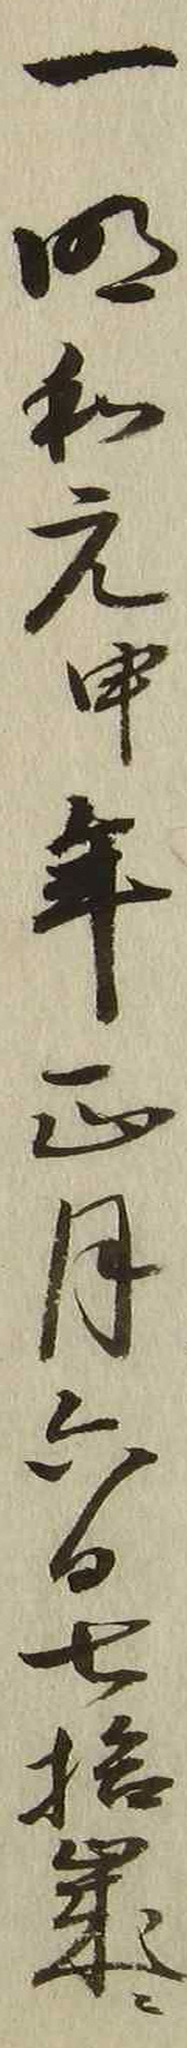一明和元申年正月六日七拾歳ニ
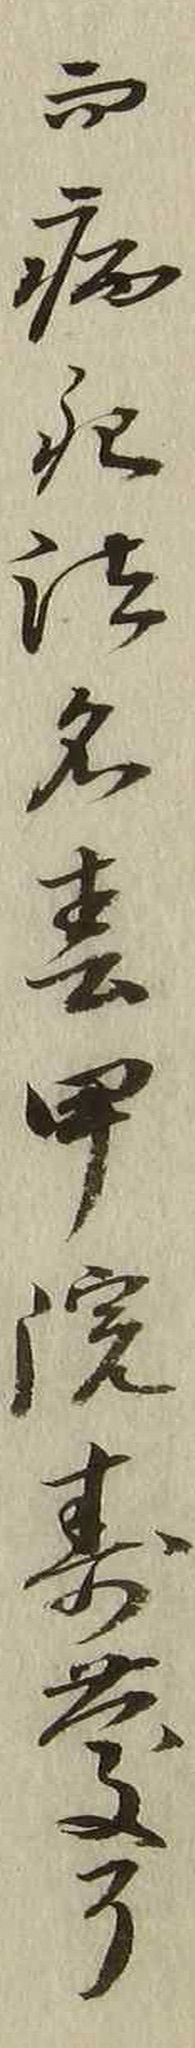而病死法名春甲院寿慶了
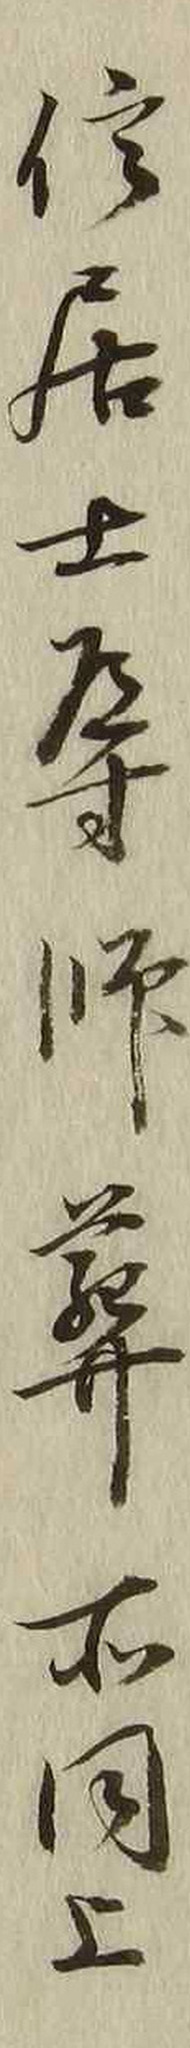信居士導師葬所同上
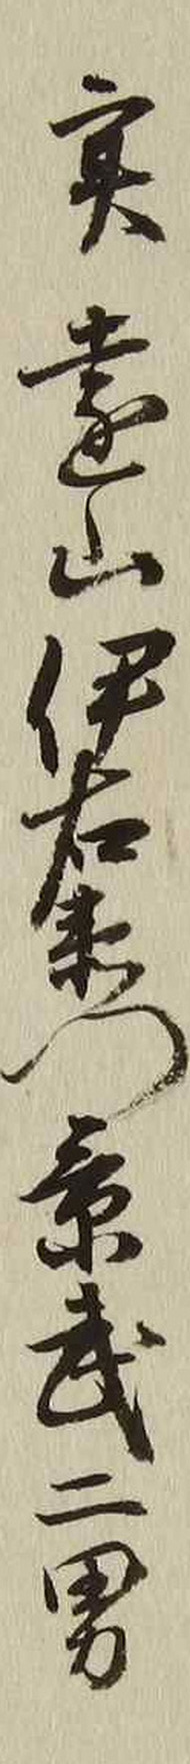実遠山伊右衛門景武二男
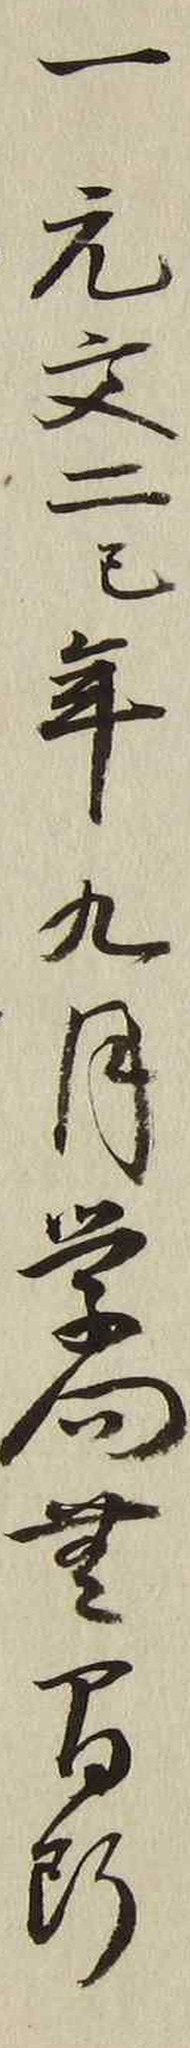一元文二巳年九月学問無間断
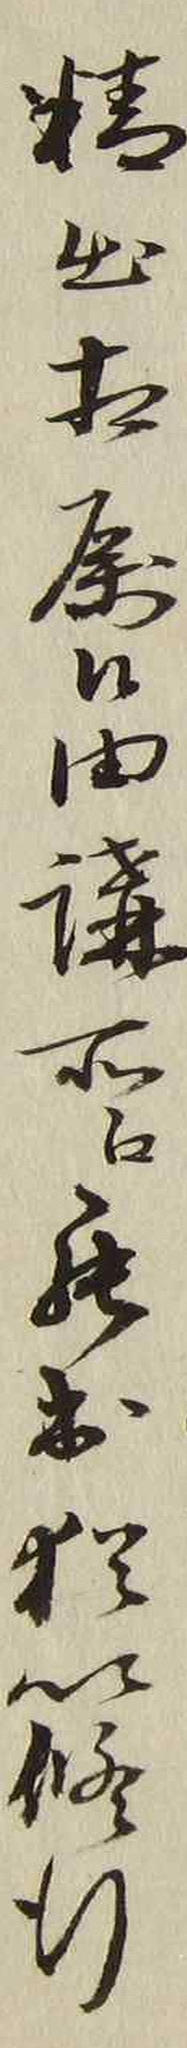精出相属候由講所江罷出猶以修行
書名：諸士系譜　巻之61　と之部4
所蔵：会津若松市立会津図書館
